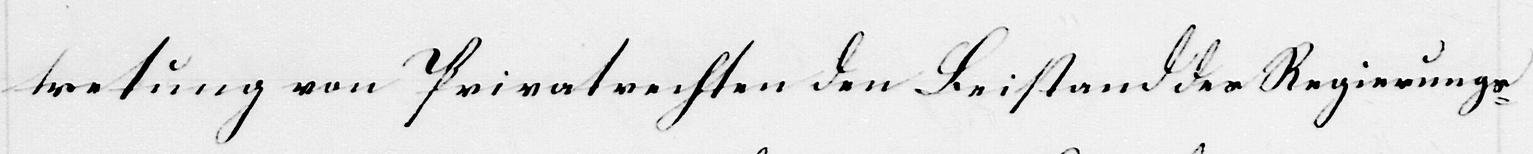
tretung von Privatrechten den Beistand des Regierungs¬
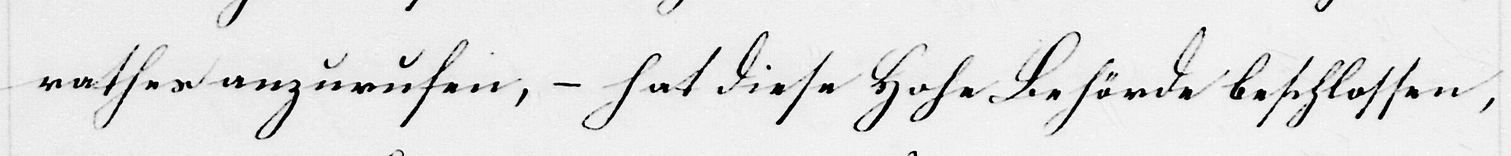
rathes anzurufen, − hat diese Hohe Behörde beschlossen,
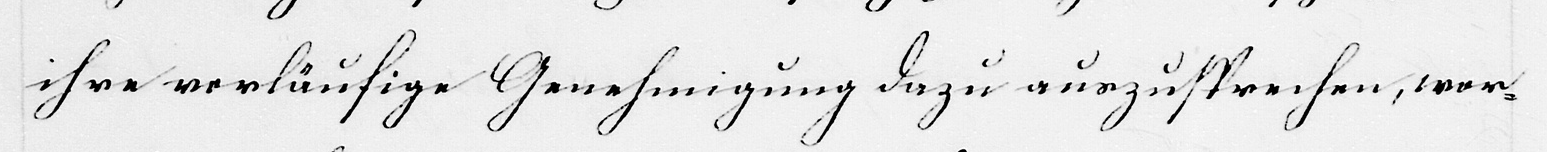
ihre vorläufige Genehmigung dazu auszusprechen, wor¬
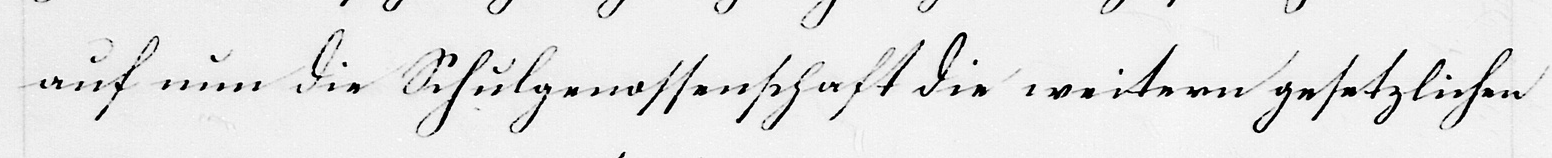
auf nun die Schulgenossenschaft die weitern gesetzlichen
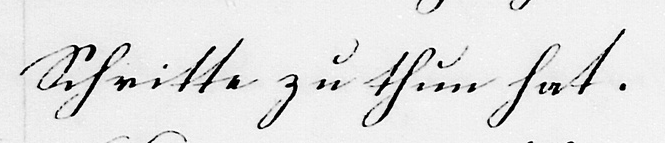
Schritte zu thun hat.
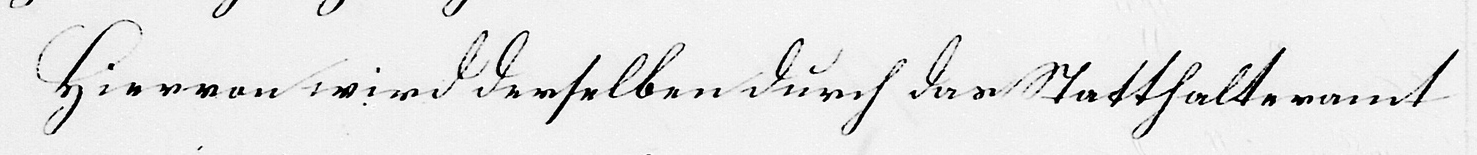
Hiervon wird derselben durch das Statthalteramt
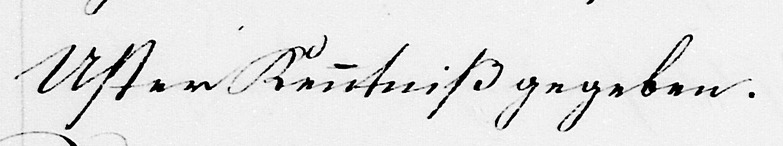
Uster Kenntniß gegeben.
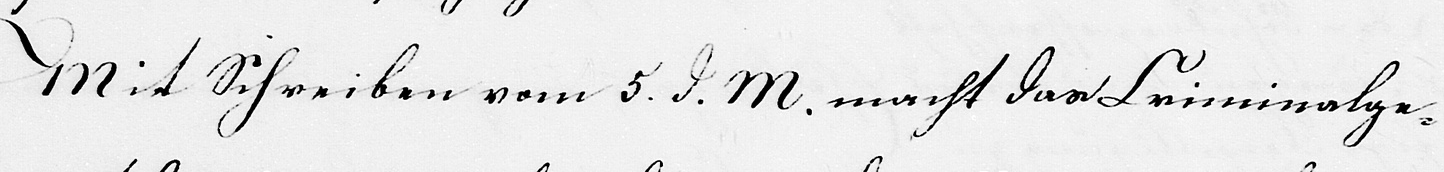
Mit Schreiben vom 5. d. M. macht das Criminalge¬
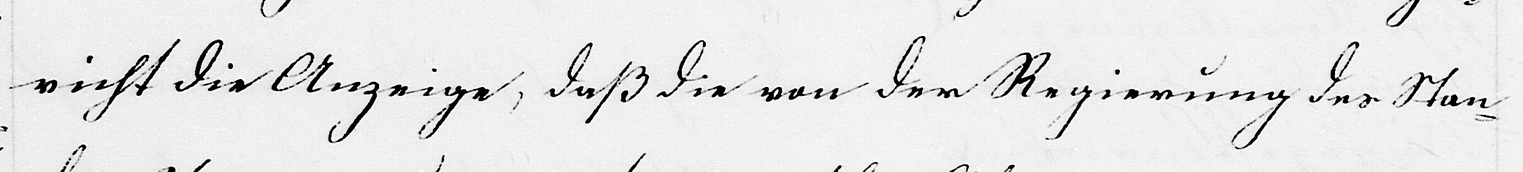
richt die Anzeige, daß die von der Regierung des Stan¬
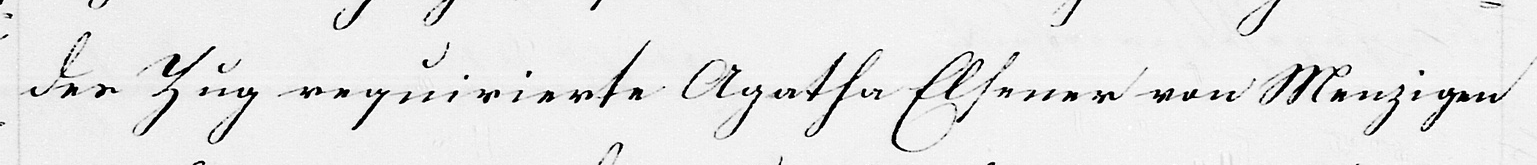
des Zug requirierte Agatha Elsener von Menzigen
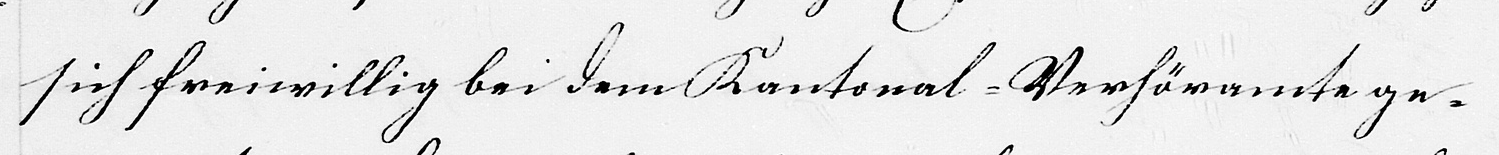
sich freiwillig bei dem Kantonal-Verhöramte ge¬
